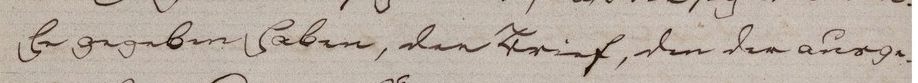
he gegeben haben, den Brief, den der ausge-
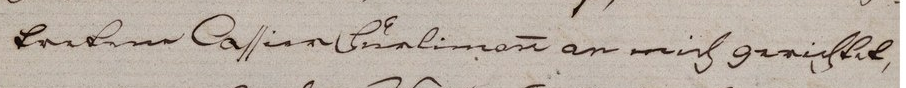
tretene Cassier Hürlimann an mich gerichtet,
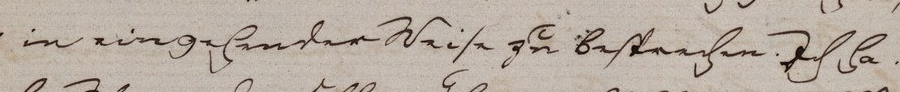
in eingehender Weise zu besprechen. Ich ha-
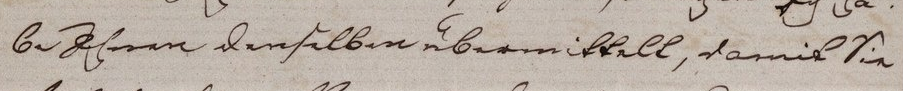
be Ihnen denselben übermittelt, damit Sie
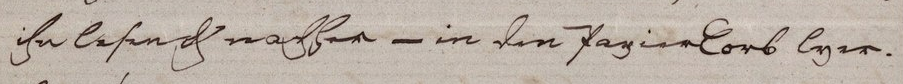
ihn lesen & nachher – in den Papierkorb wer-
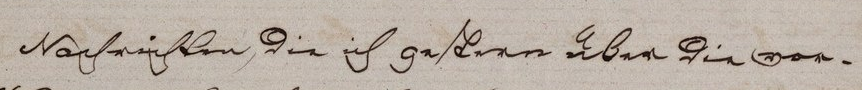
Nachrichten, die ich gestern über die vor-
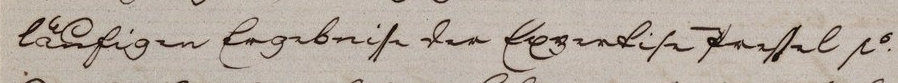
läufigen Ergebnisse der Expertise Pressel po
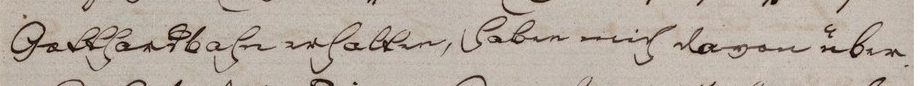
Gotthardbahn erhalten, haben mich davon über-
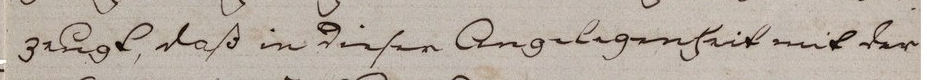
zeugt, daß in dieser Angelegenheit mit der
